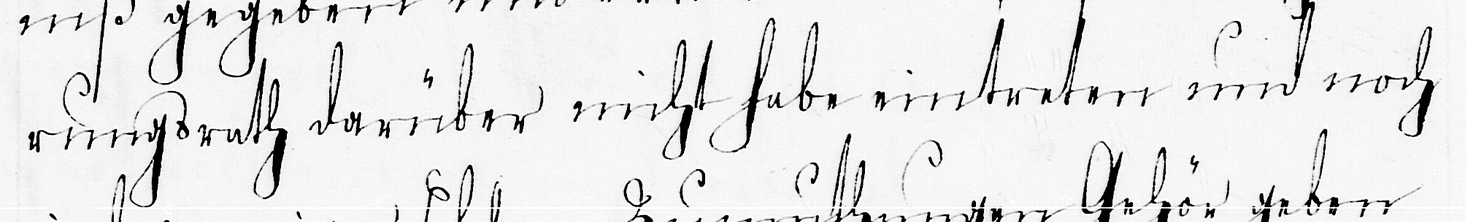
rungsrath darüber nicht habe eintreten und noch
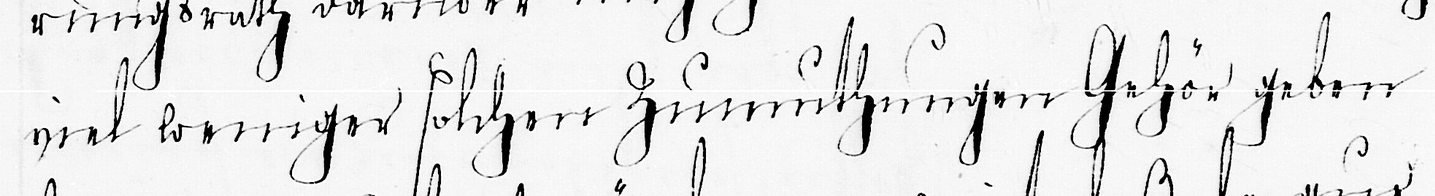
viel weniger solchen Zumuthungen Gehör geben
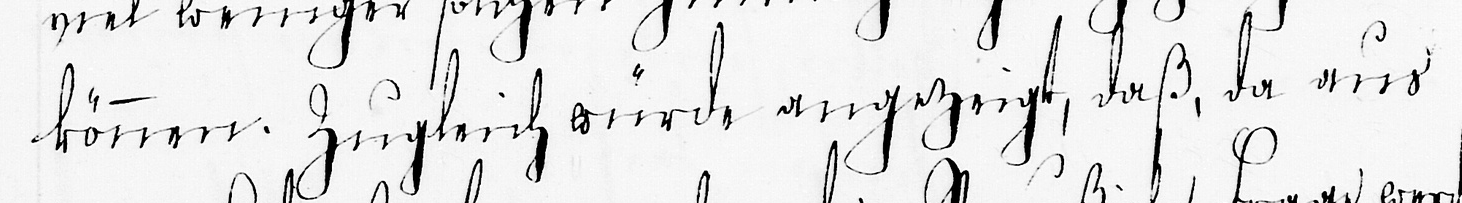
können. Zugleich würde angezeigt, daß, da aus
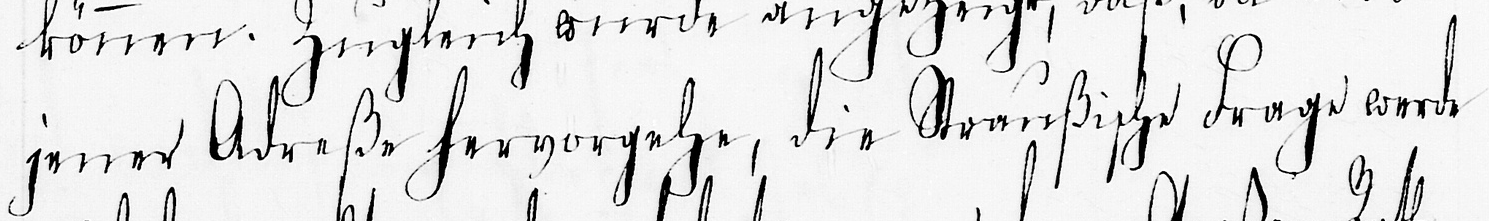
jener Adreße hervorgehe, die Straußische Frage werde
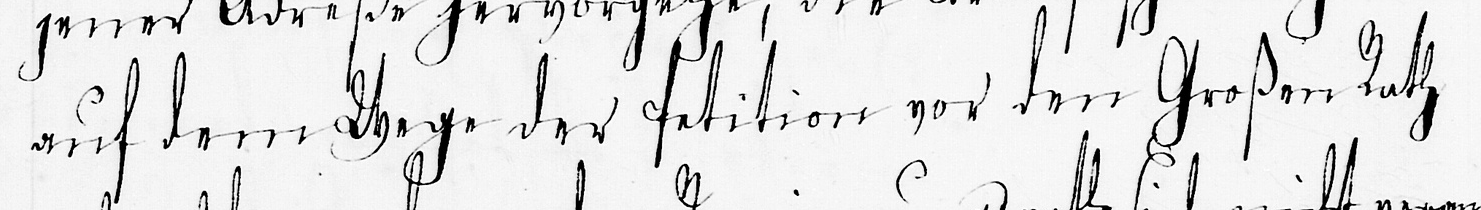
auf dem Wege der Petition vor den Großen Rath
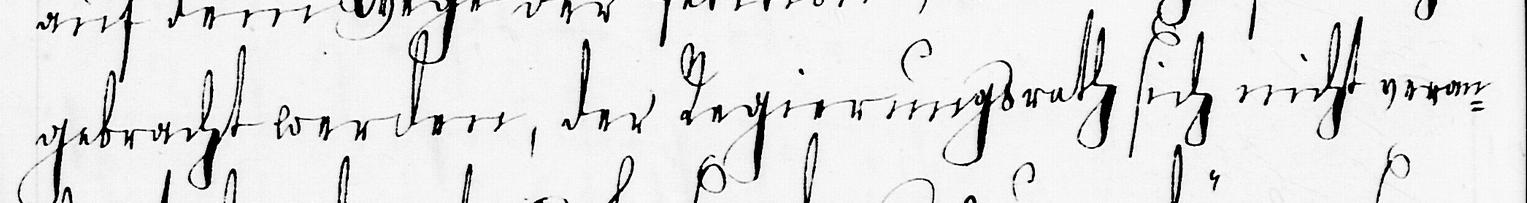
gebracht werden, der Regierungsrath sich nicht veran¬
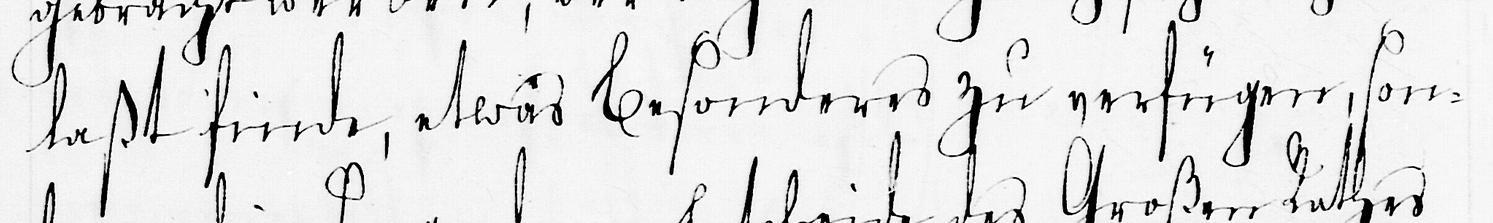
laßt finde, etwas Besonderes zu verfügen, son¬
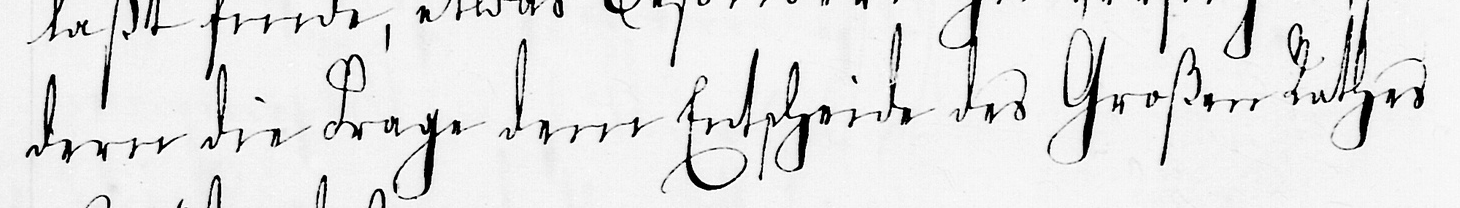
dern die Frage dem Entscheide des Großen Rathes
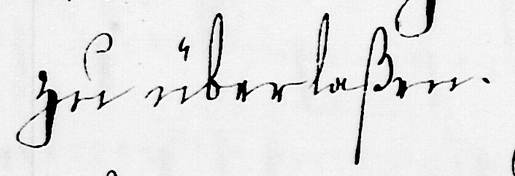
zu überlaßen.
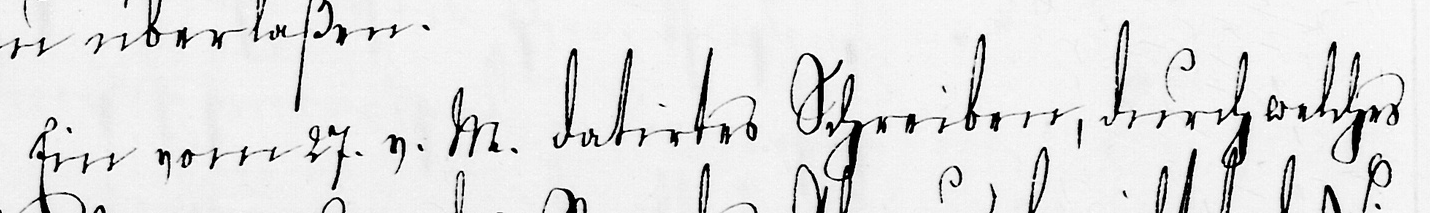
Ein vom 27. v. M. datirtes Schreiben, durch welches
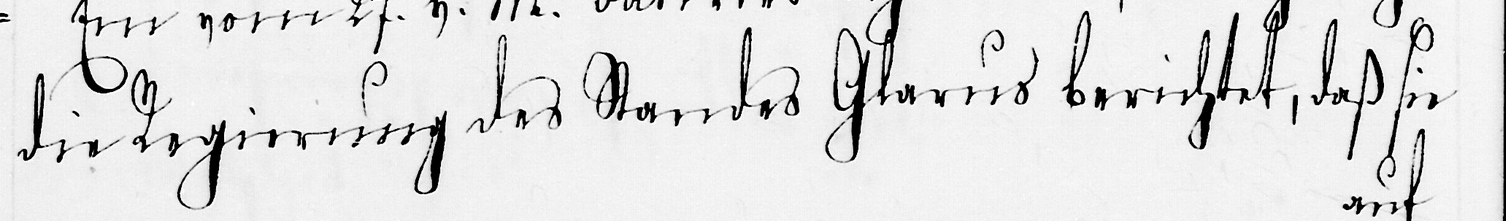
die Regierung des Standes Glarus berichtet, daß sie
